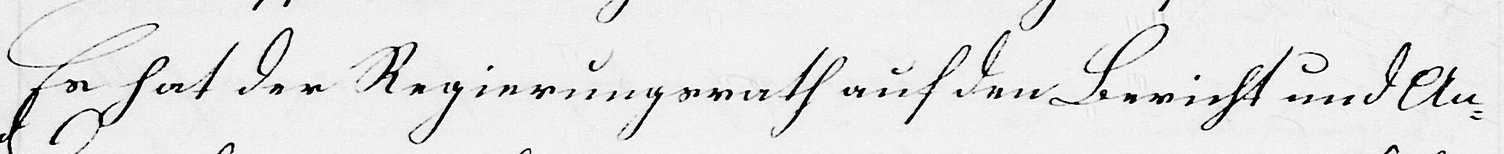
Es hat der Regierungsrath auf den Bericht und An¬
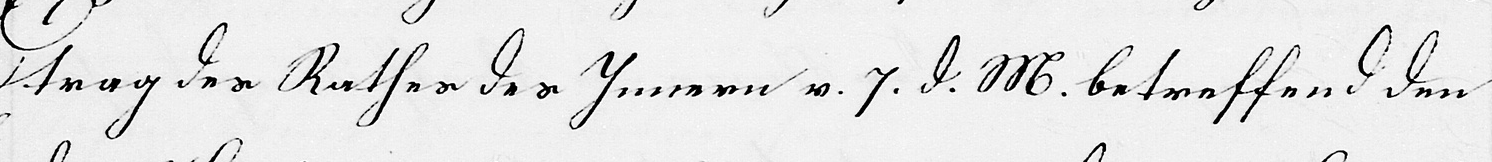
trag des Rathes des Innern v. 7. d. M. betreffend den
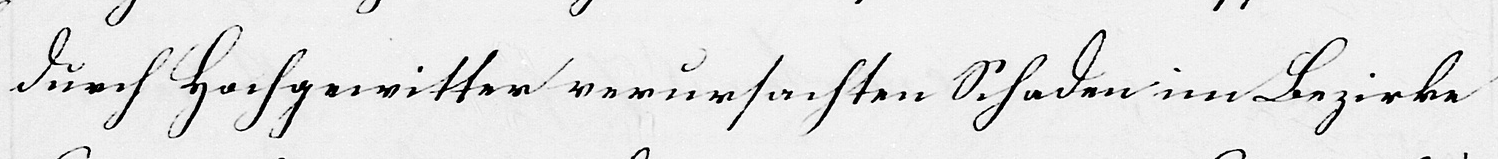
durch Hochgewitter verursachten Schaden im Bezirke
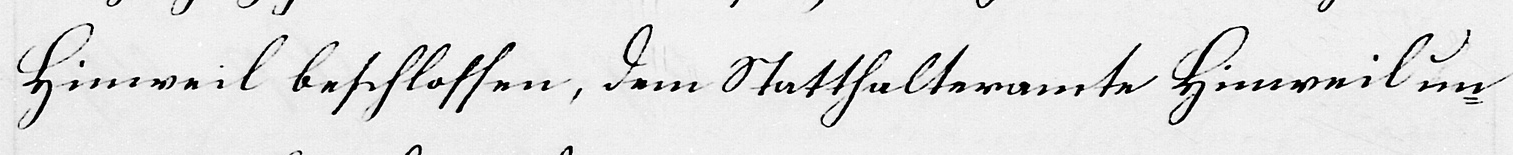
Hinweil beschlossen, dem Statthalteramte Hinweil un¬
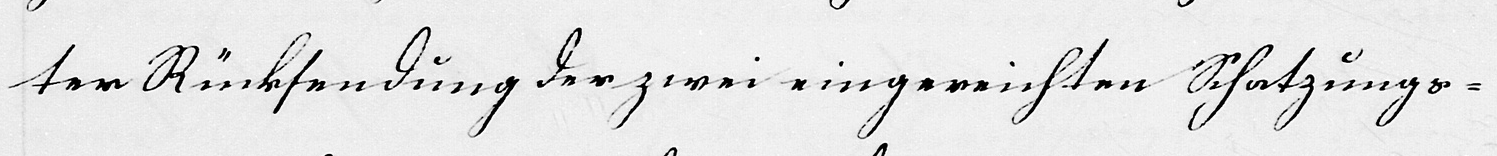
ter Rücksendung der zwei eingereichten Schatzungs¬
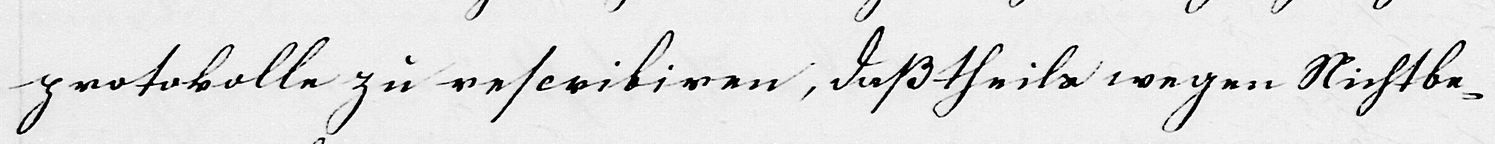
protokolle zu rescribiren, daß theils wegen Nichtbe¬
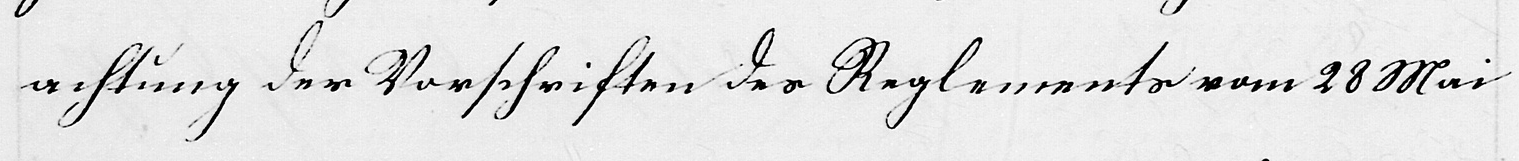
achtung der Vorschriften des Reglements vom 28. Mai
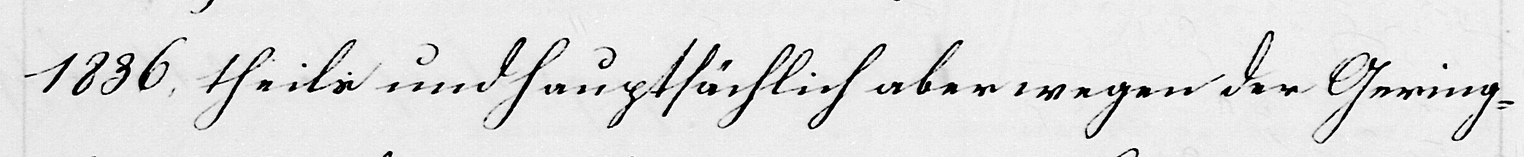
1836, theils und hauptsächlich aber wegen der Gering¬
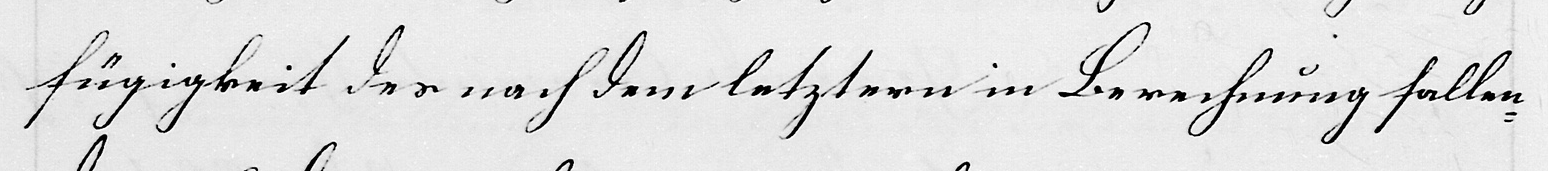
fügigkeit des nach dem letztern in Berechnung fallen¬
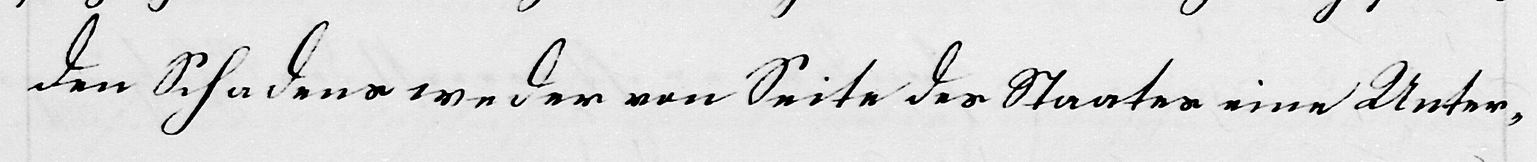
den Schadens weder von Seite des Staates eine Unter-
